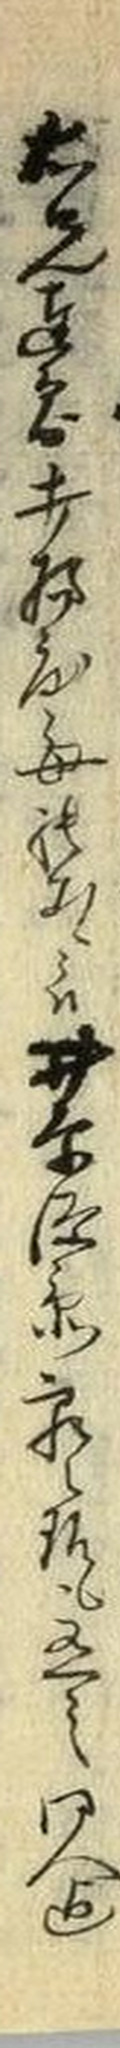右先達而ゟ打揚度毎罷出候ニ付井原源兵衛願之趣も有之同人迄
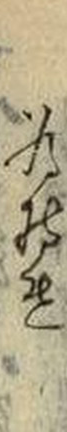為持遣
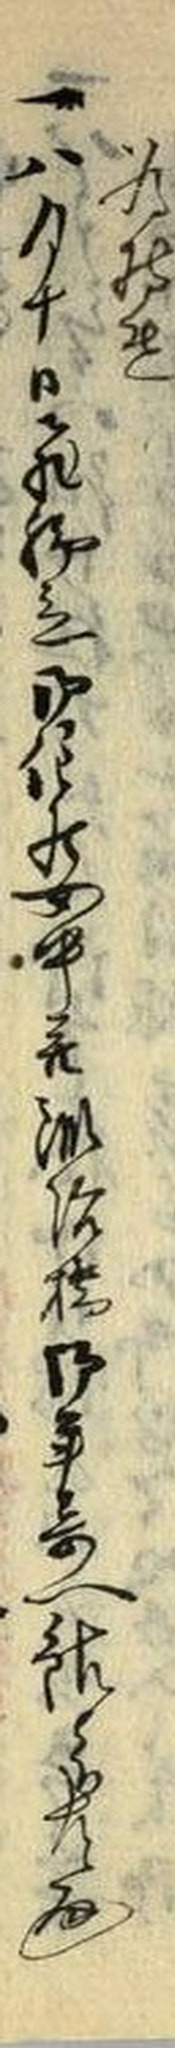一八月十日飛脚立御住居女中幷鍛冶橋御年寄へ鮎被下左之通
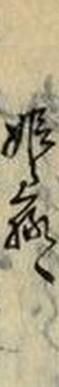姫君様へ
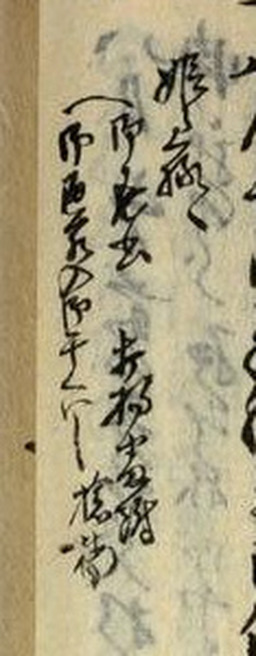御返書打揚番附
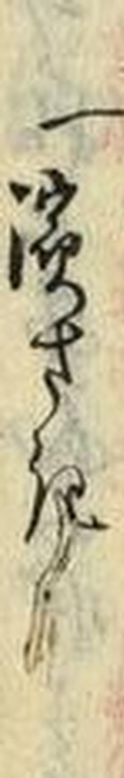浜さき
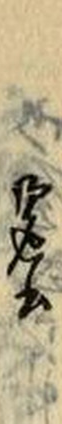御返書
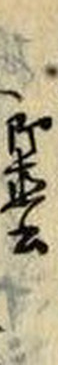御直書
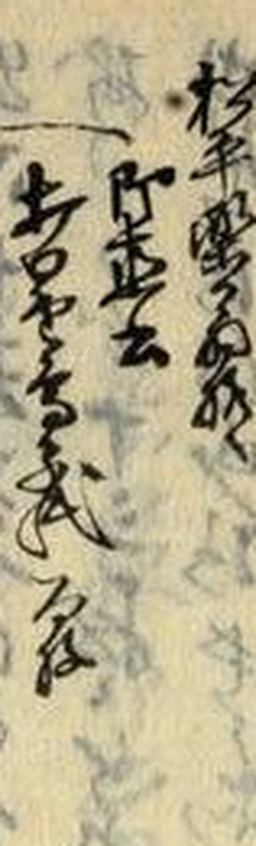打曇鳥子紙百枚
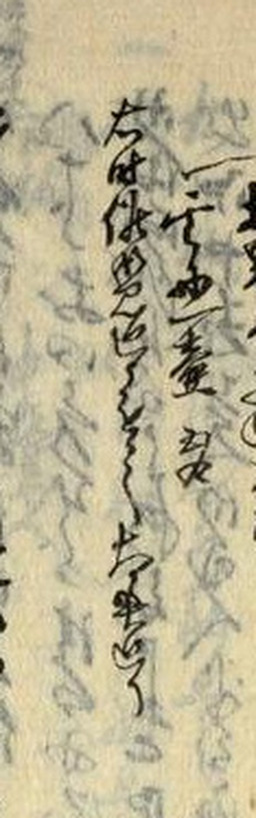右時候御見廻被進之大奥廻り
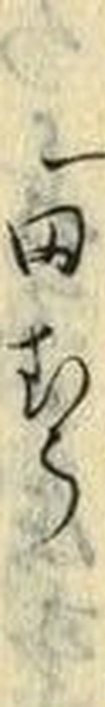田むら
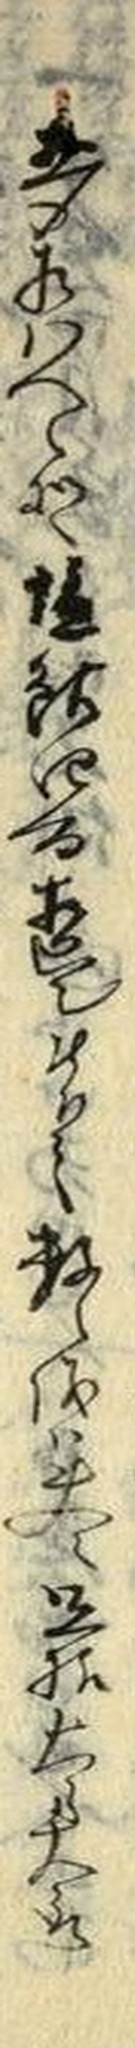惣〆拾八人之処へ塩鮎四百相廻シ被下之数之儀ハ夫々足様大奥取
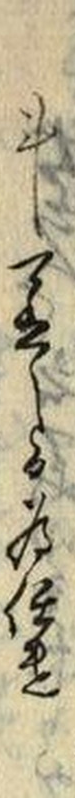計可有之旨為任遣
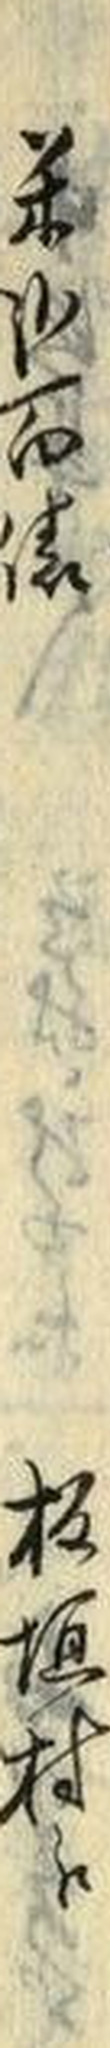米弐百俵板垣村江
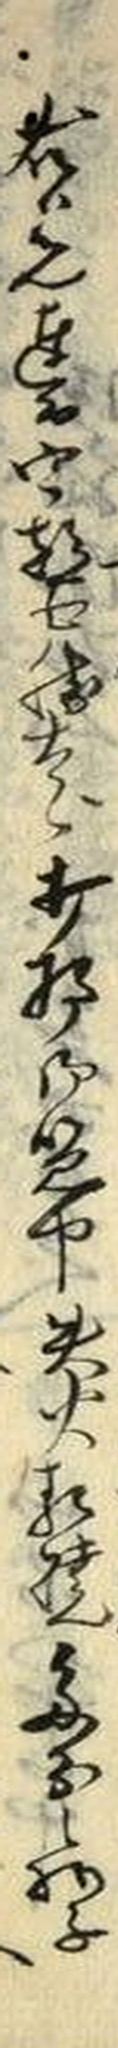右ハ先達而宇都宮勝太郎打揚御覧中失火類焼多分之様子
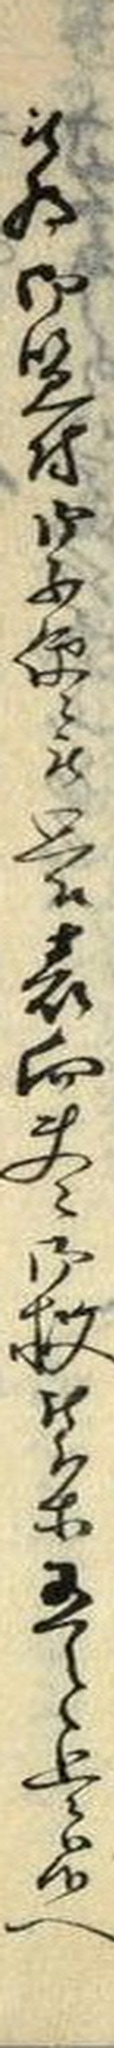被為御覧付御不便ニ被思召表向夫々御救被下等有之候上ニハ候へ
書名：少傅日録抄（斉承付側向頭取日記、在国）
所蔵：福井県文書館 Fukui Prefectural Archives
